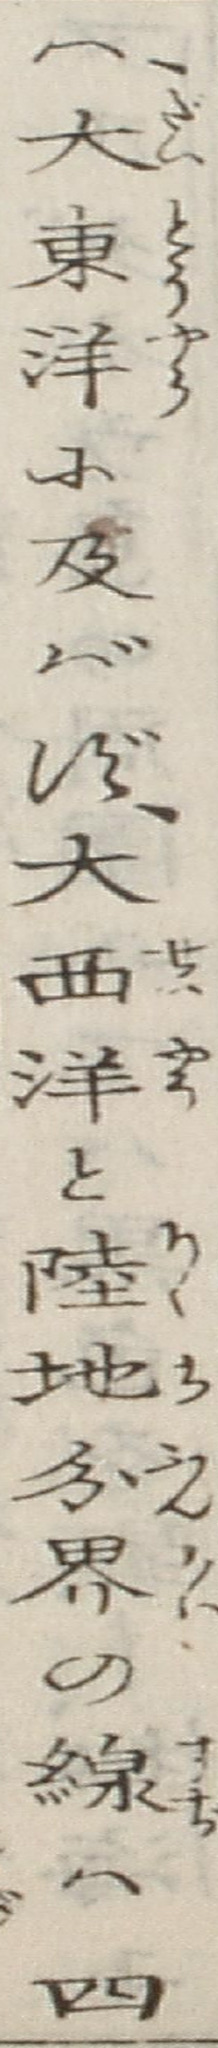は、大東洋に及ばず、大西洋と陸地分界の線は四
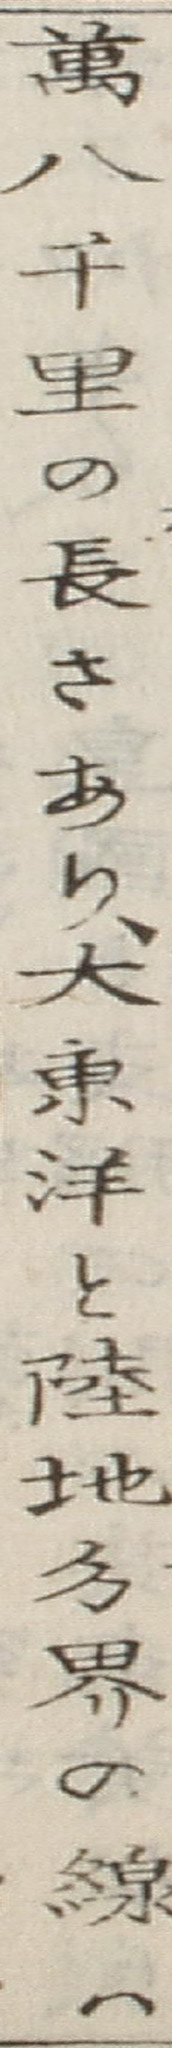万八千里の長さあり、大東洋と陸地分界の線は
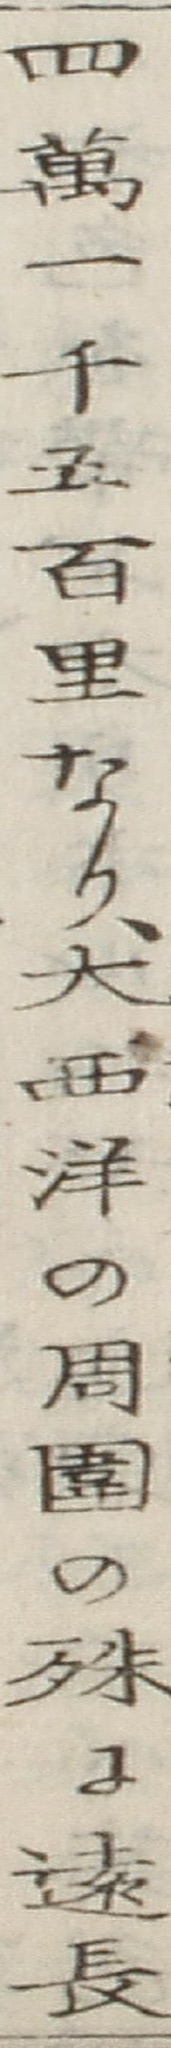四万一千五百里なり、大西洋の周囲の殊に遠長
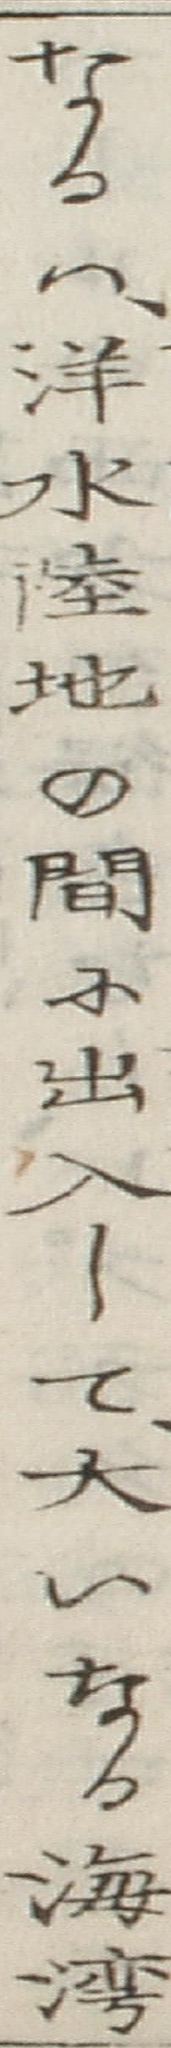なるは、洋水陸地の間に出入して、大いなる海湾
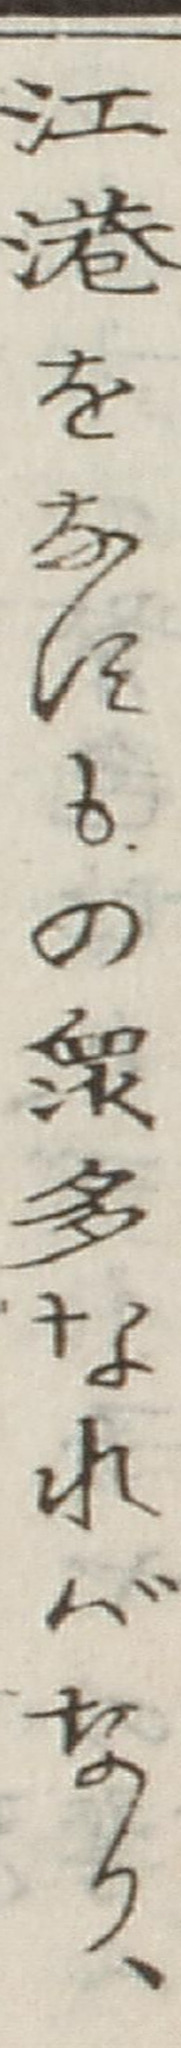江港をなすもの衆多なればなり、
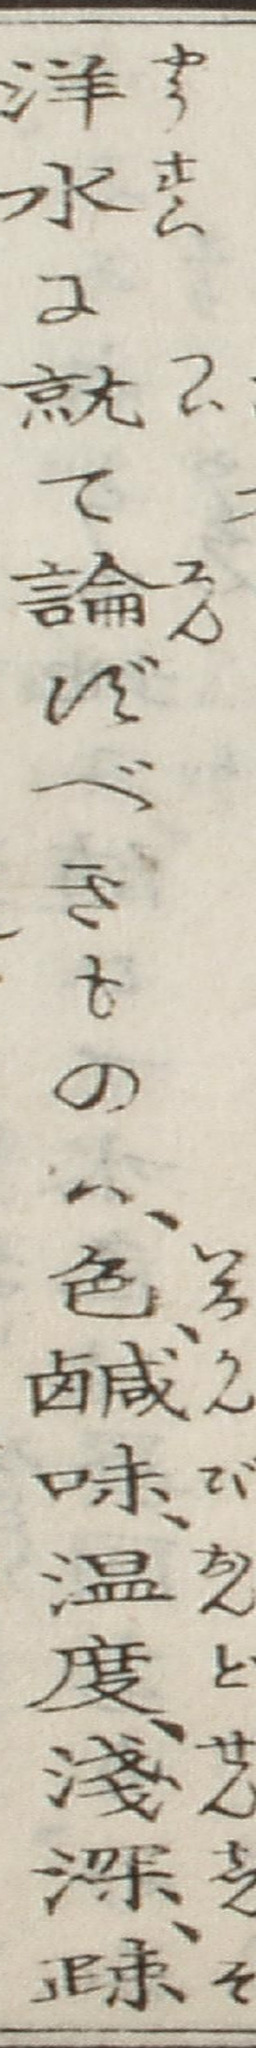洋水に就て論ずべきものは、色、鹹味、温度、浅深、踈
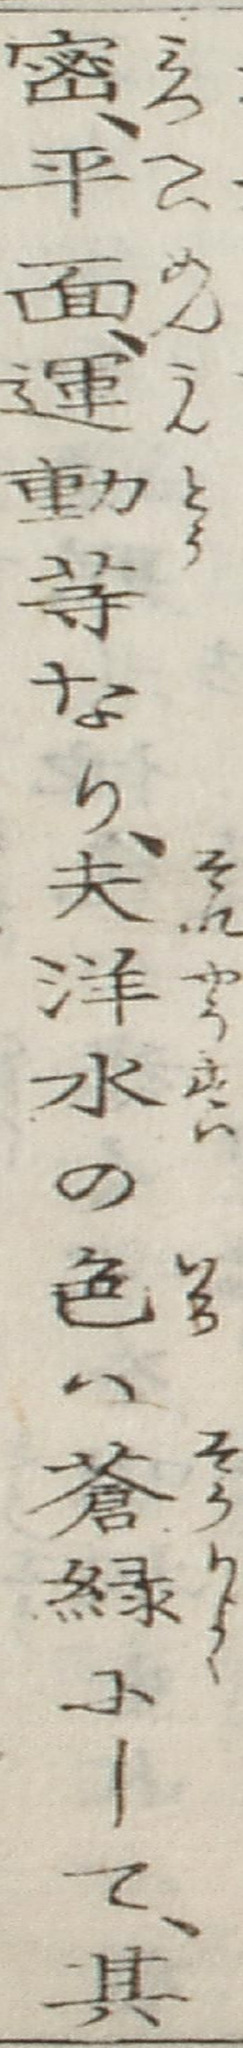密、平面、運動等なり、夫洋水の色は蒼緑にして、其
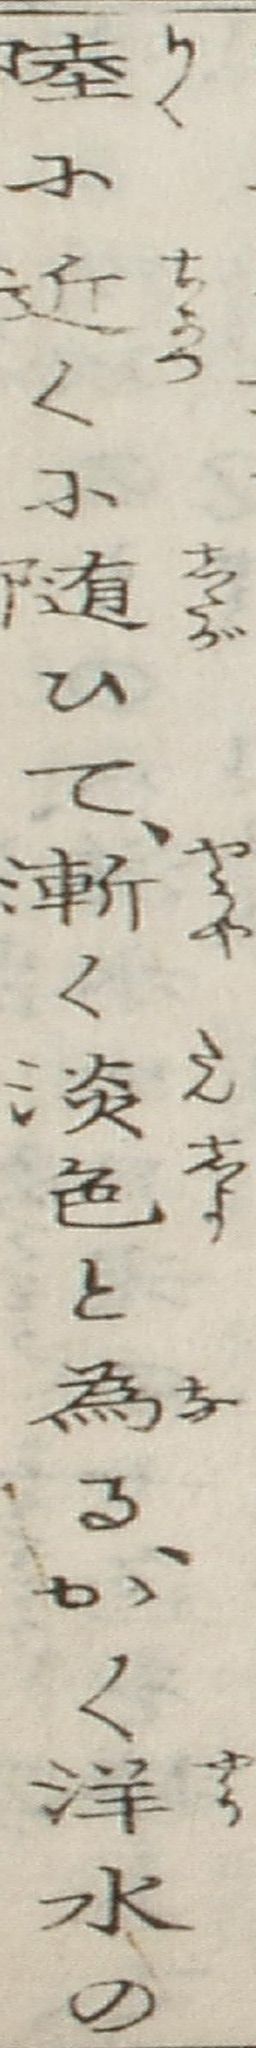陸に近くに随ひて、漸く淡色と為る、かく洋水の

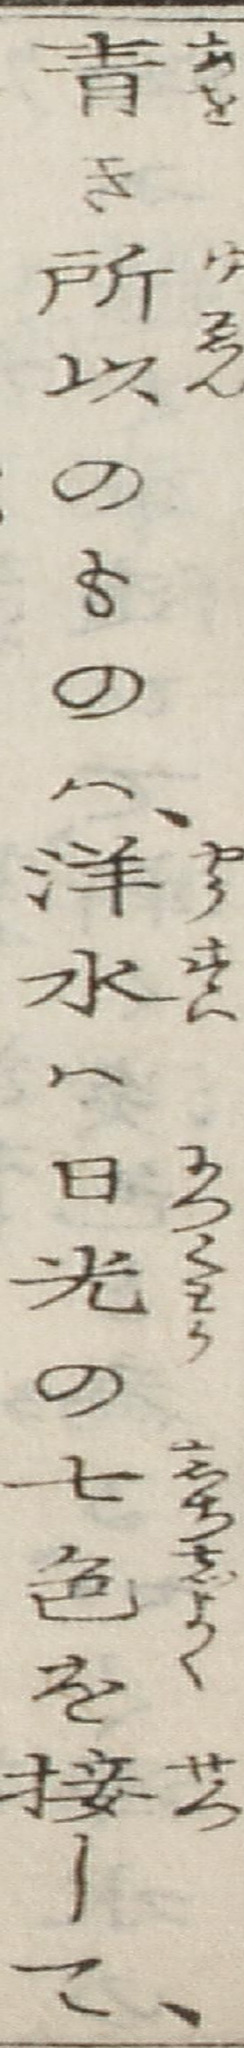青き所以のものは、洋水は日光の七色を接して、
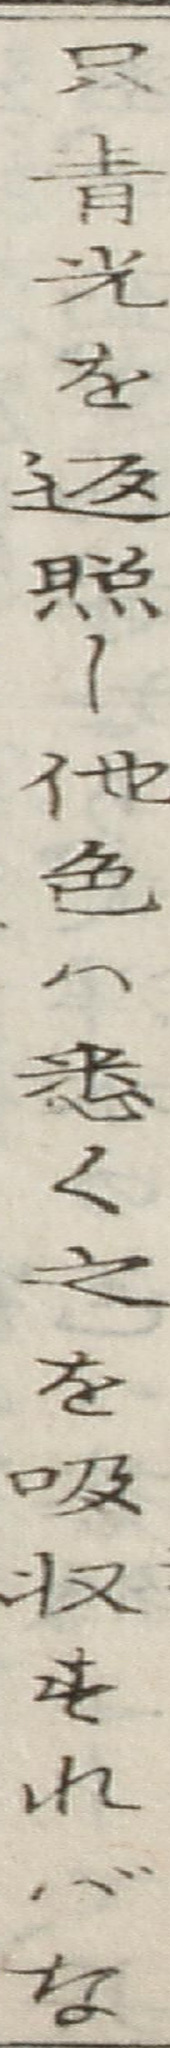只青光を返照し他色は悉く之を吸収すればな
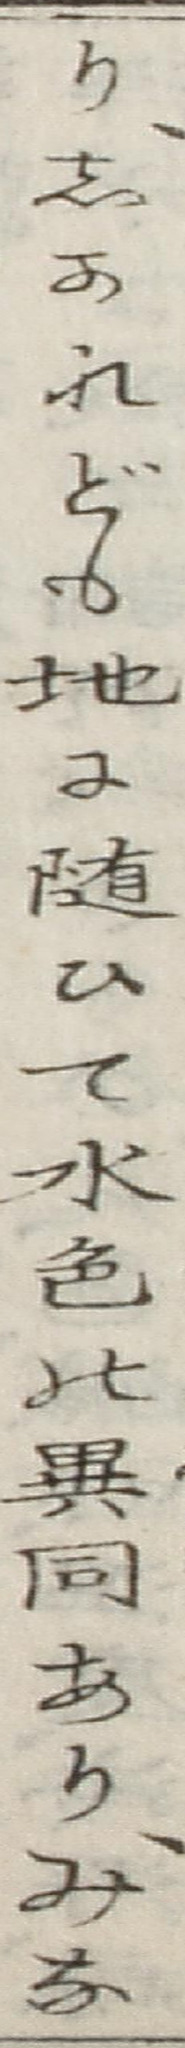り、しかれども地に随ひて水色の異同あり、みな
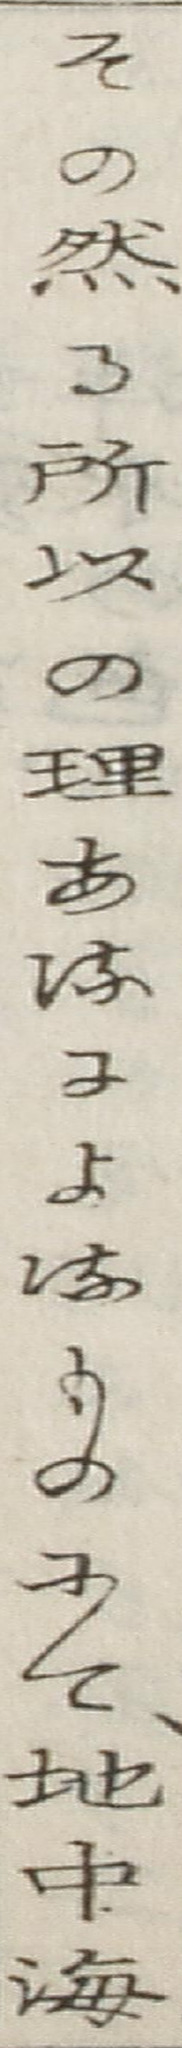その然る所以の理あるによるものにて、地中海
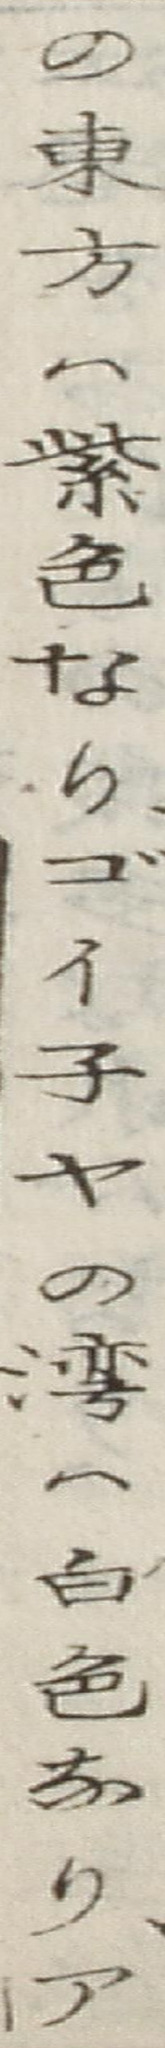の東方は紫色なり、ゴイ子ヤの湾は白色なり、ア
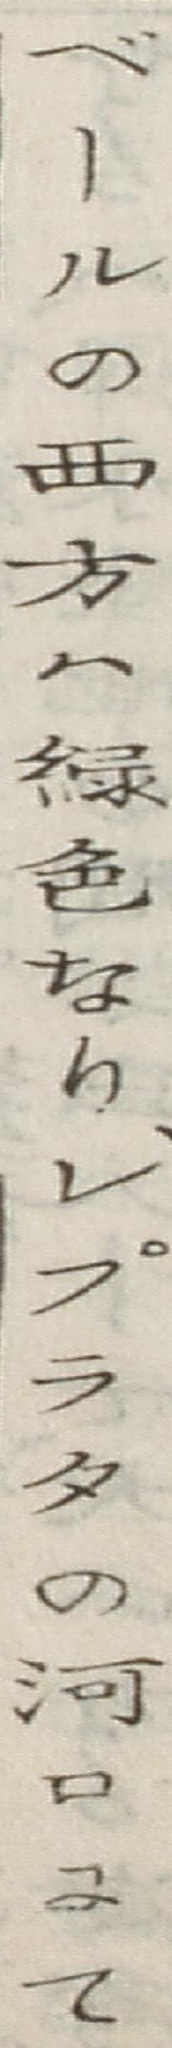ベールの西方は緑色なり、レプラタの河口にて
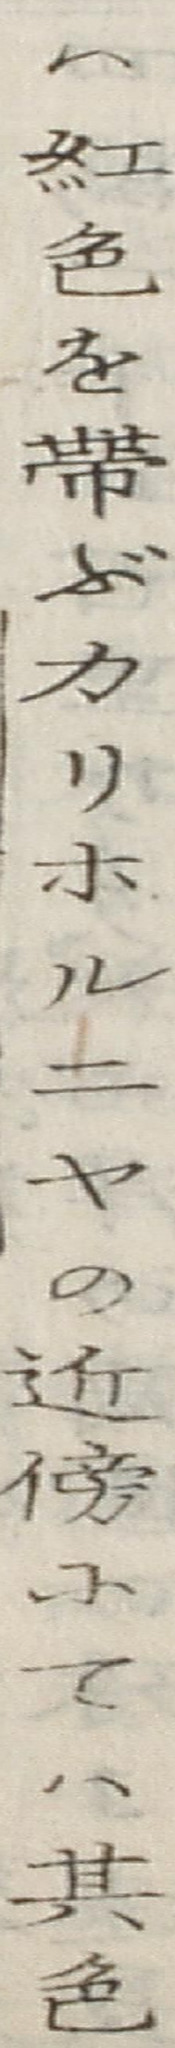は紅色を帯ぶ、カリホルニヤの近傍にては其色
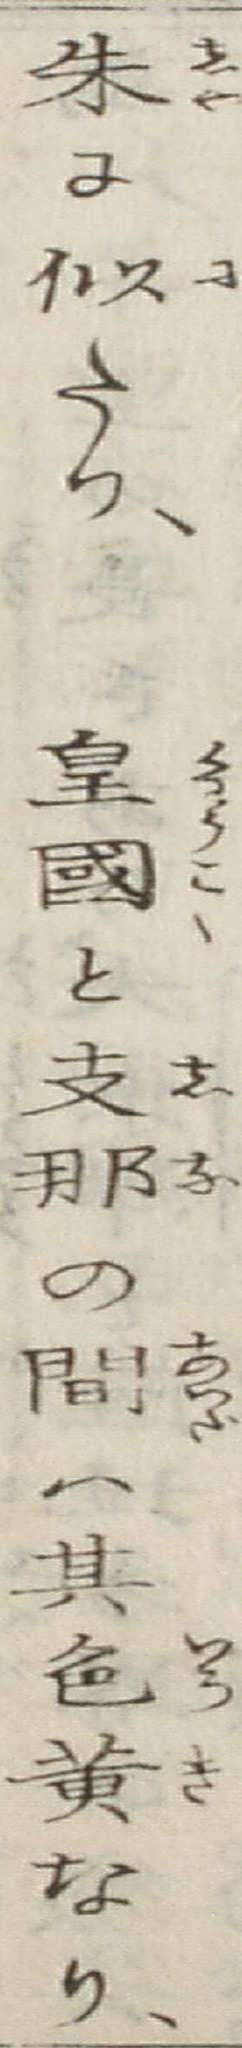朱に似たり、皇国と支那の間は其色黄なり、
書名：訓蒙　天然地理學　中
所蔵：東京大学地震研究所図書室 Earthquake Research Institute Library, The University of Tokyo, JAPAN
